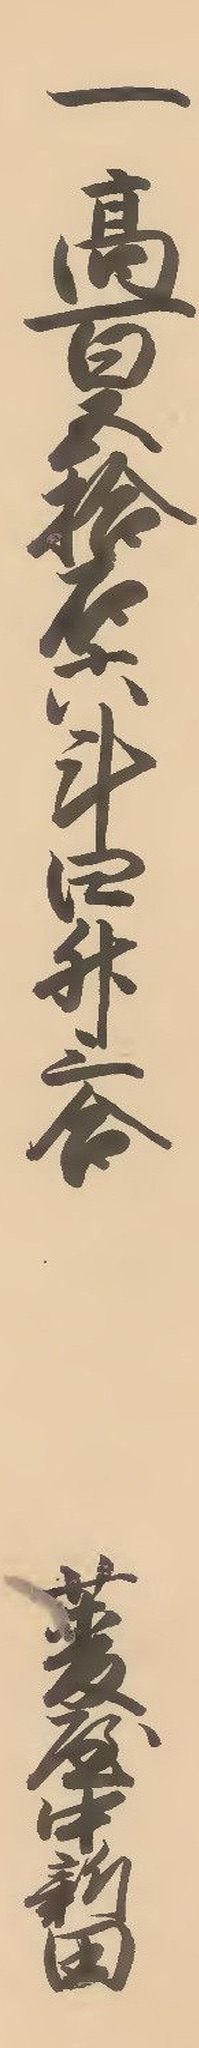一高百五拾石六斗四升三合菱屋中新田
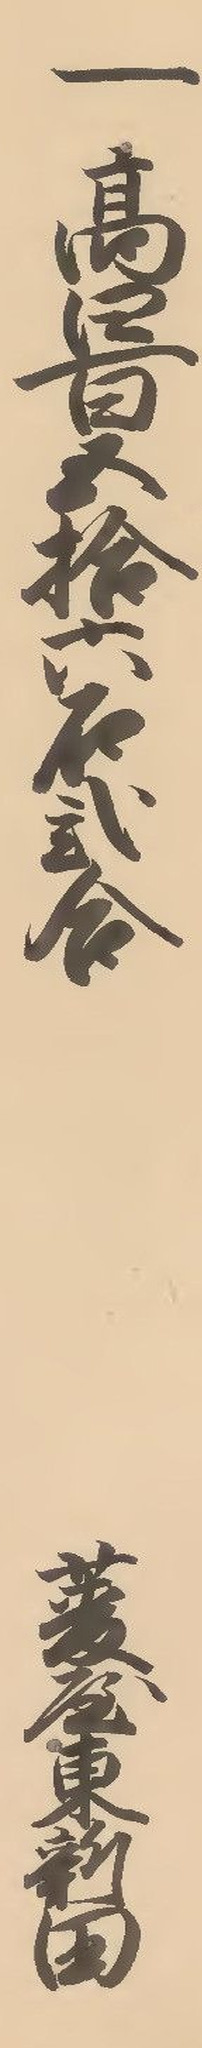一高四百五拾六石弐合菱屋東新田
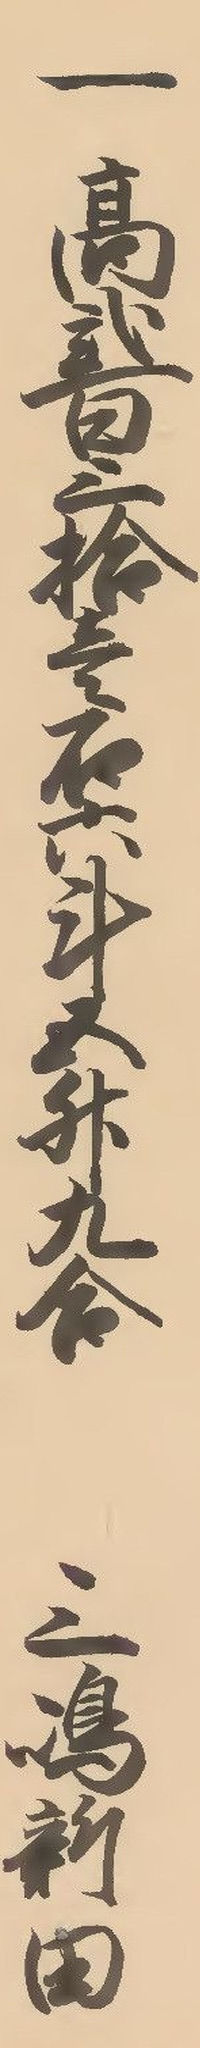一高弐百三拾壱石六斗五升九合三島新田
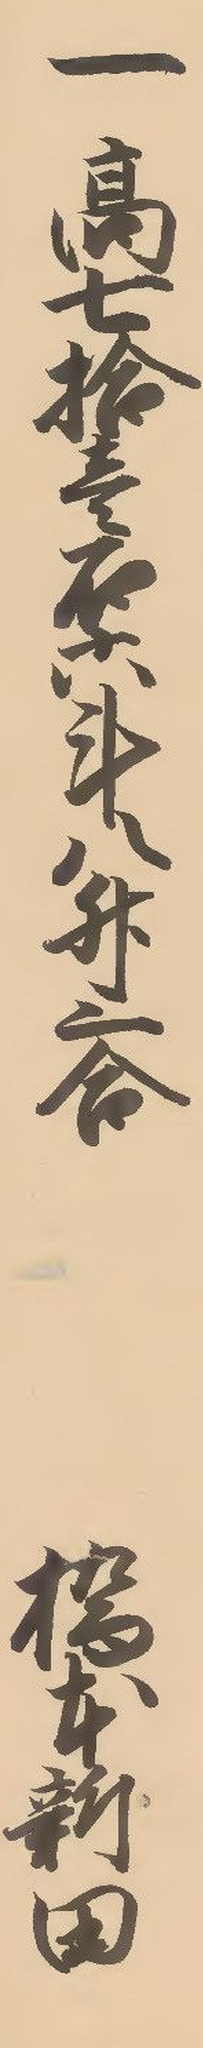一高七拾壱石六斗八升三合橋本新田
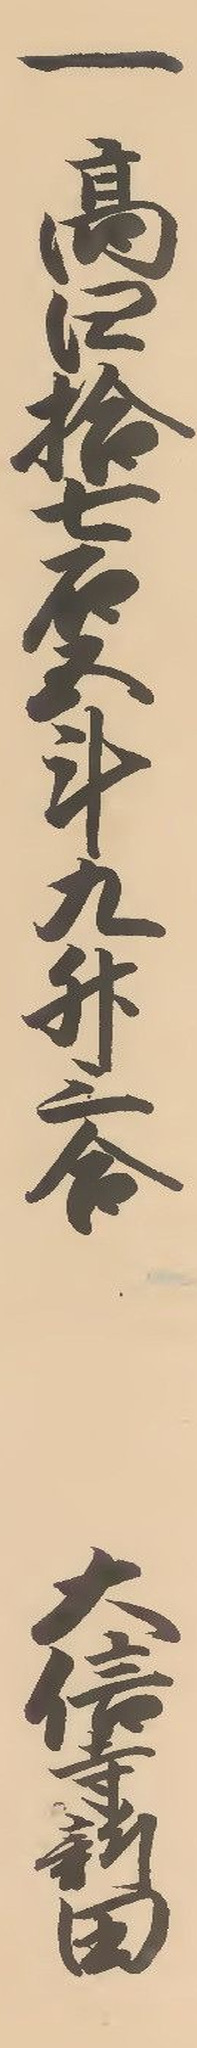一高四拾七石五斗九升三合大信寺新田
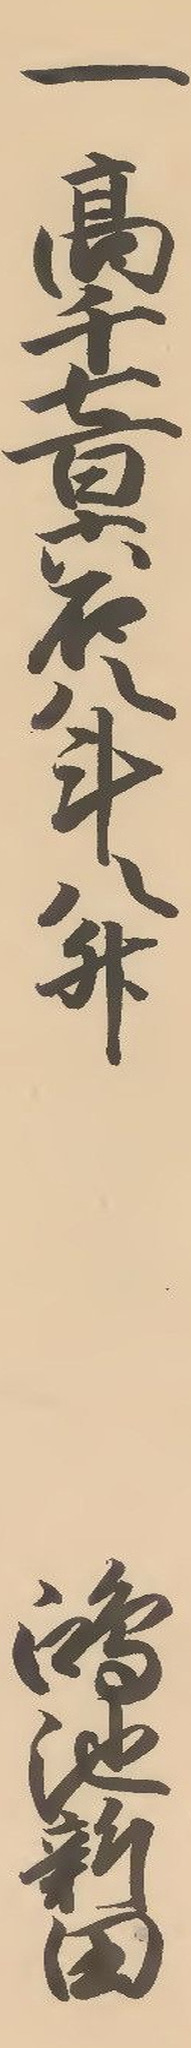一高千七百六石八斗八升島池新田
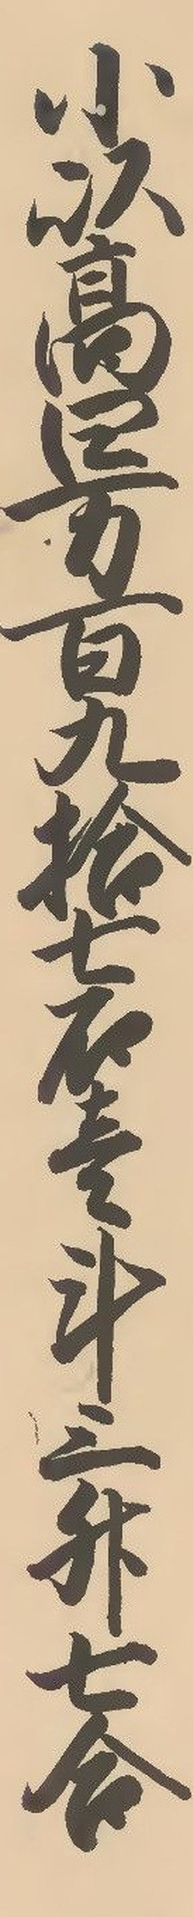小以高四万百九拾七石壱斗三升七合

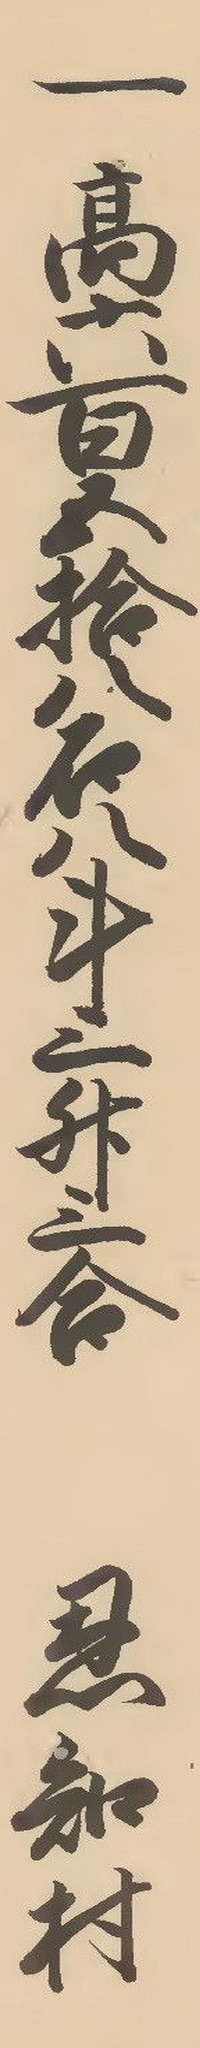一高六百五拾八石八斗三升三合恩知村
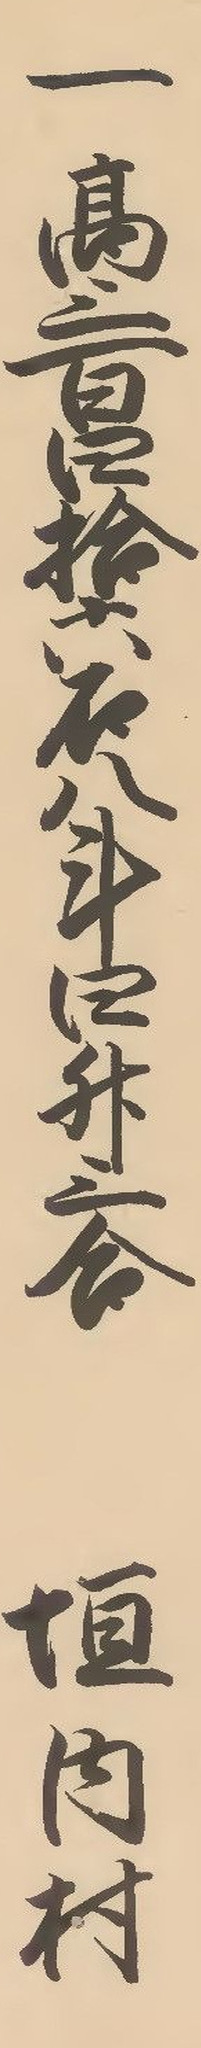一高三百四拾六石八斗四升三合垣内村
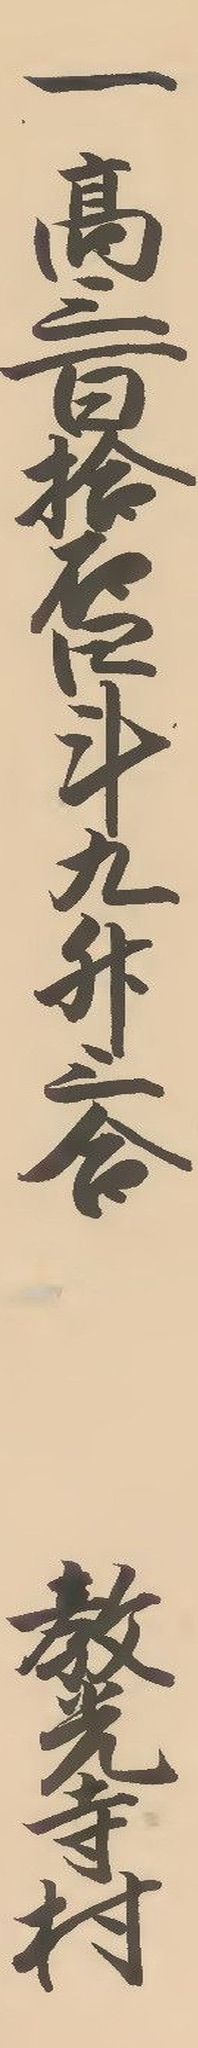一高三百拾石四斗九升三合教光寺村
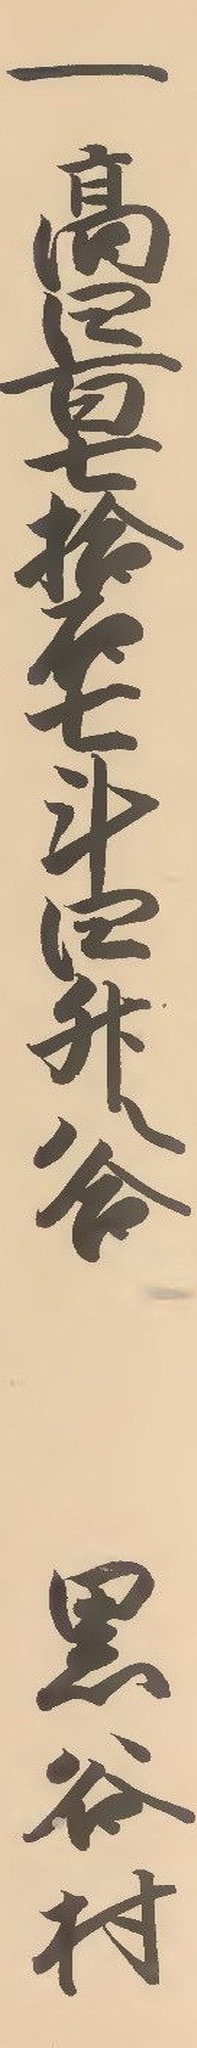一高四百七拾石七斗四升八合黒谷村
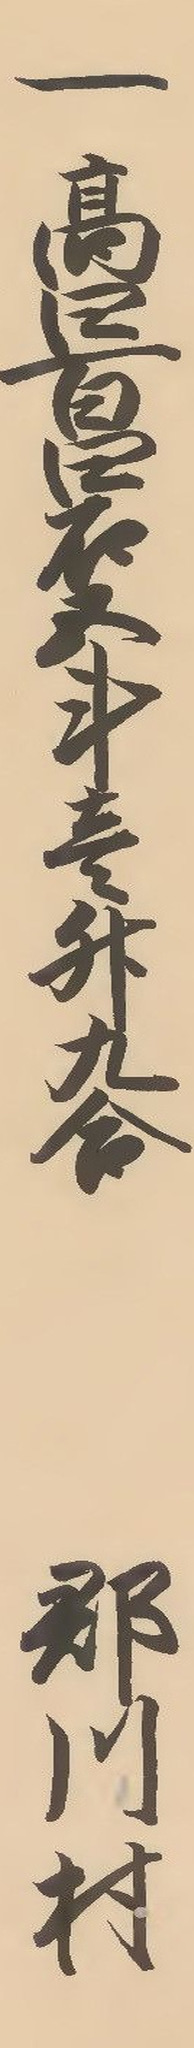一高四百四石五斗壱升九合郡川村
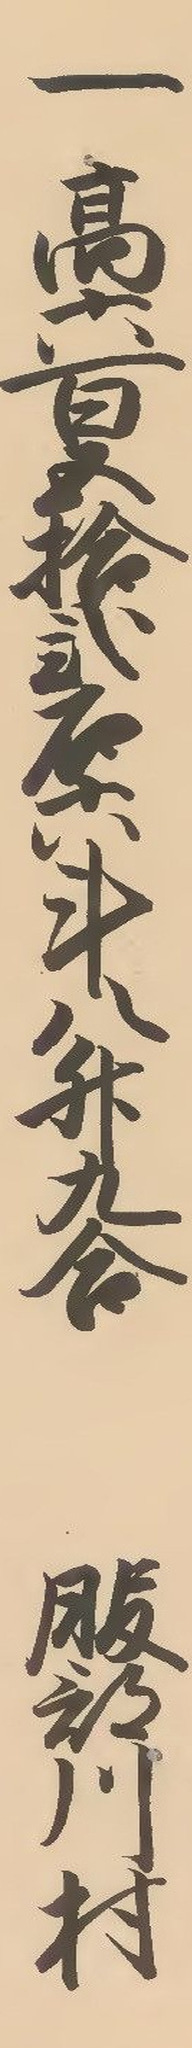一高六百五拾弐石六斗八升九合服部川村
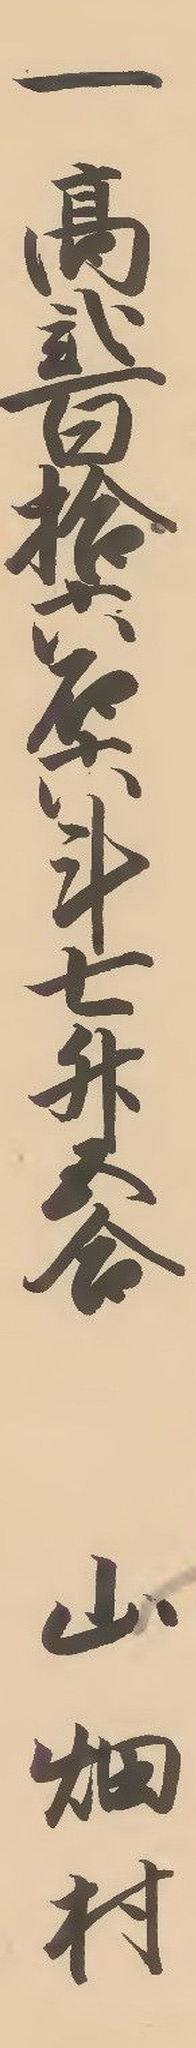一高弐百拾六石六斗七升五合山畑村

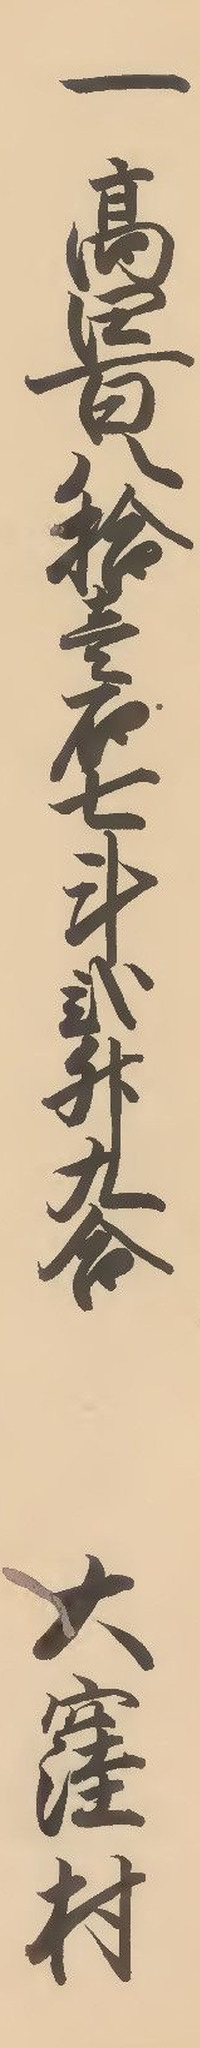一高四百八拾壱石七斗弐升九合大窪村
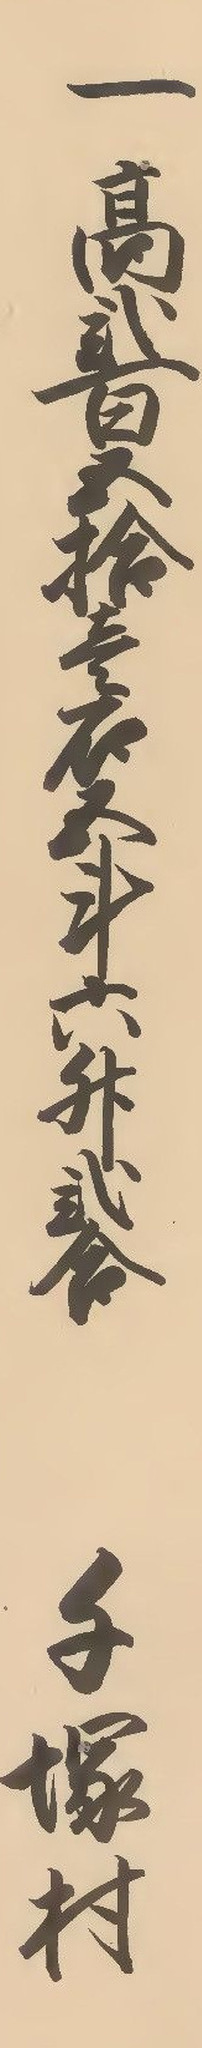一高弐百五拾壱石五斗六升弐合千塚村
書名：河内国郷帳
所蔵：国立公文書館 National Archives of Japan
